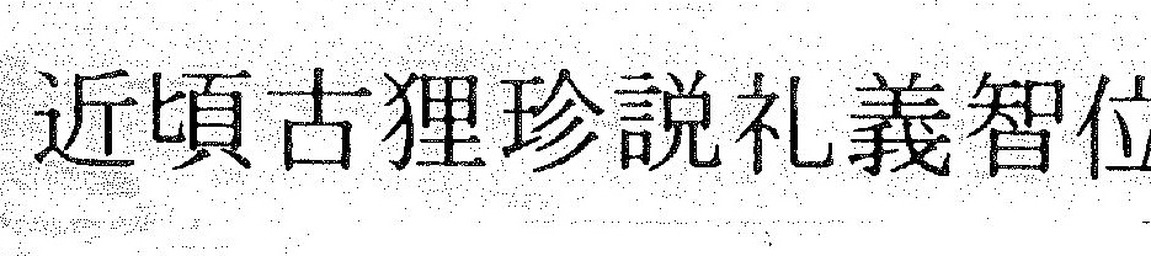書名近頃古狸珍説礼義智位
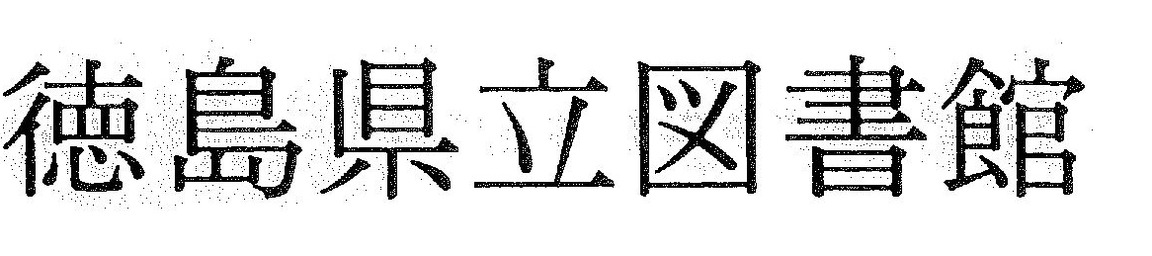徳島県立図書館
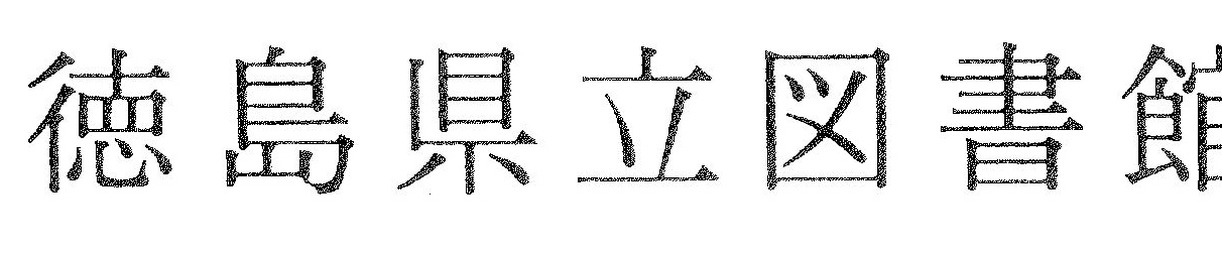徳島県立図書館

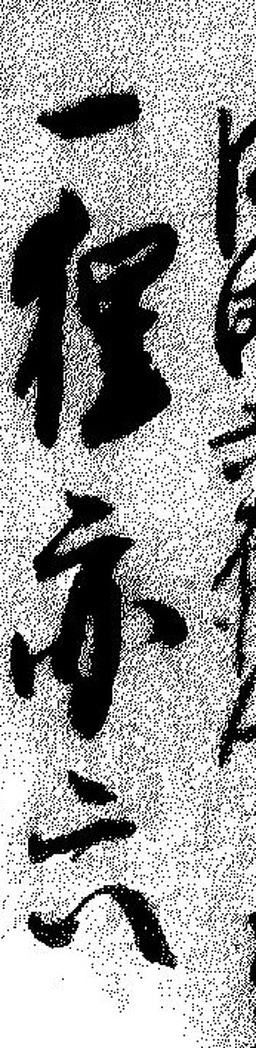一狸亦六
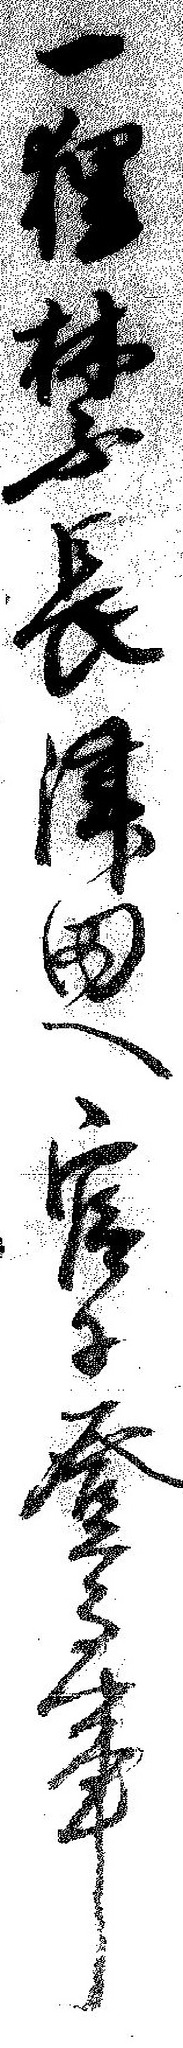一狸禁長津田へ官に登る事
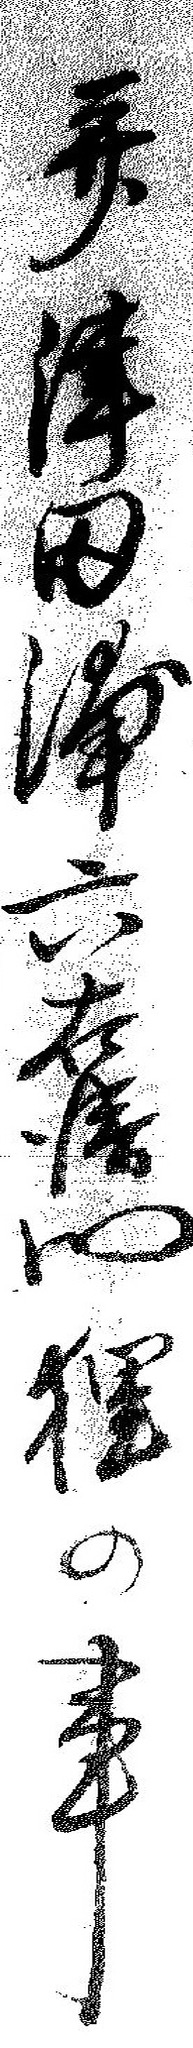并津田浦六右衛門狸の事
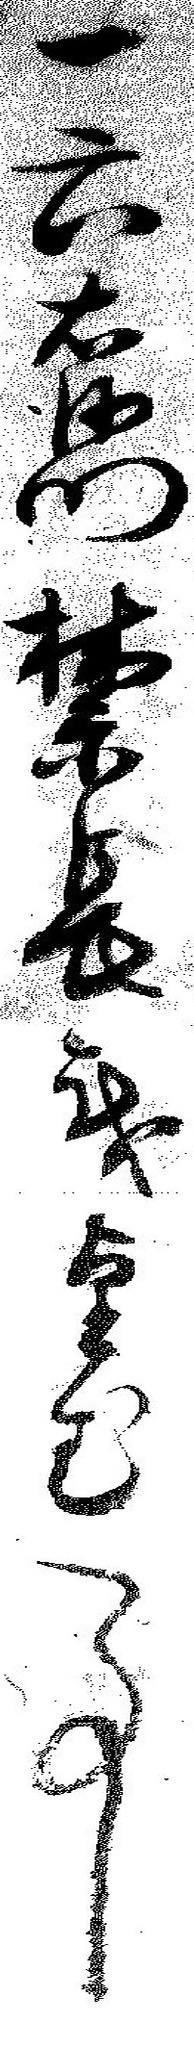一六右衛門禁長義望む事
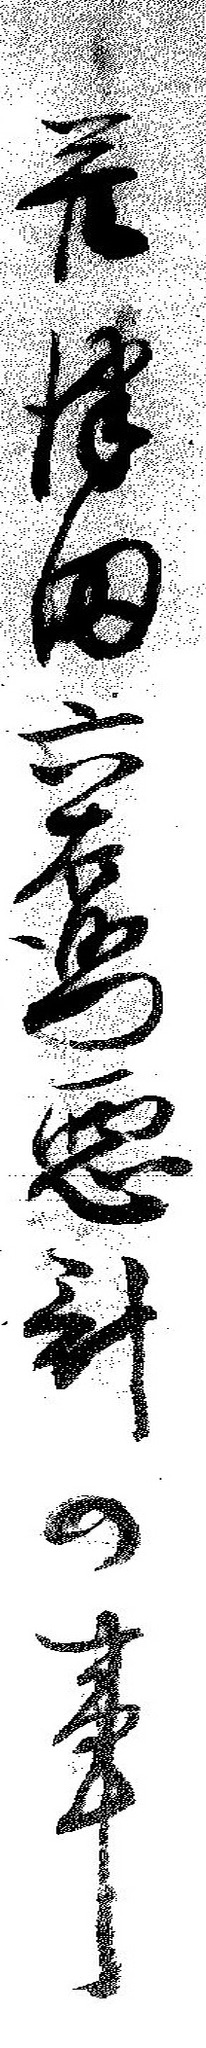并津田六右衛門悪計の事
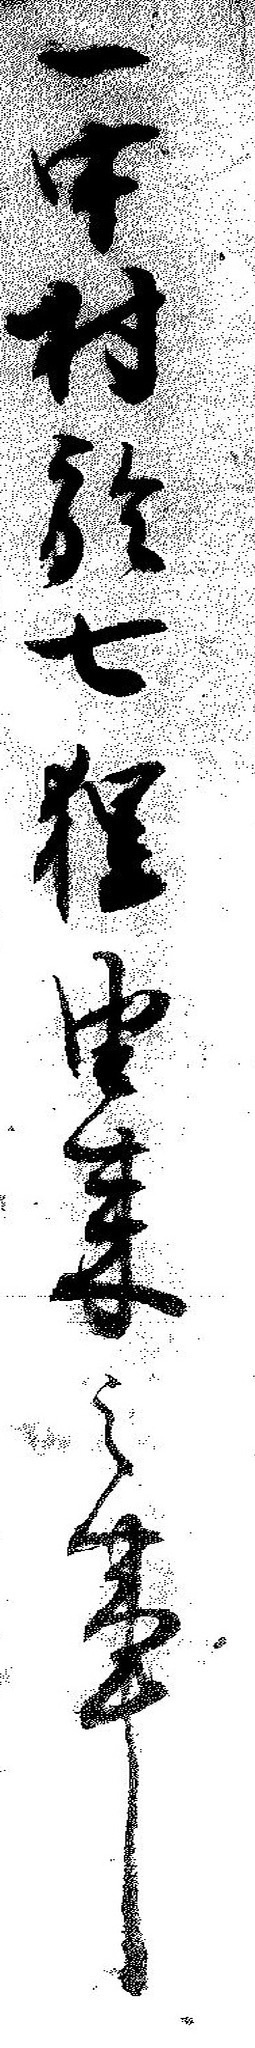一中村乾七狸由来之事
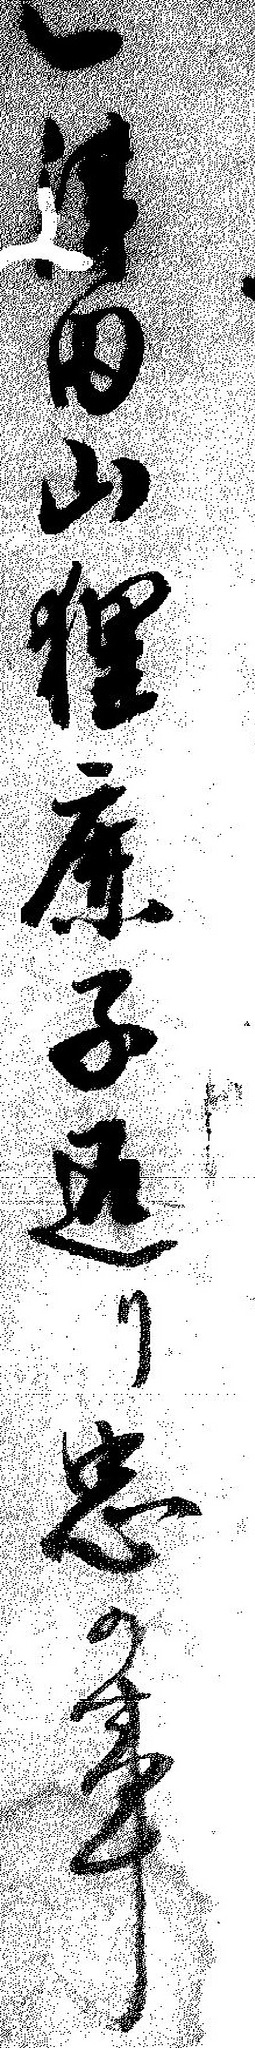一津田山狸鹿子返り忠の事
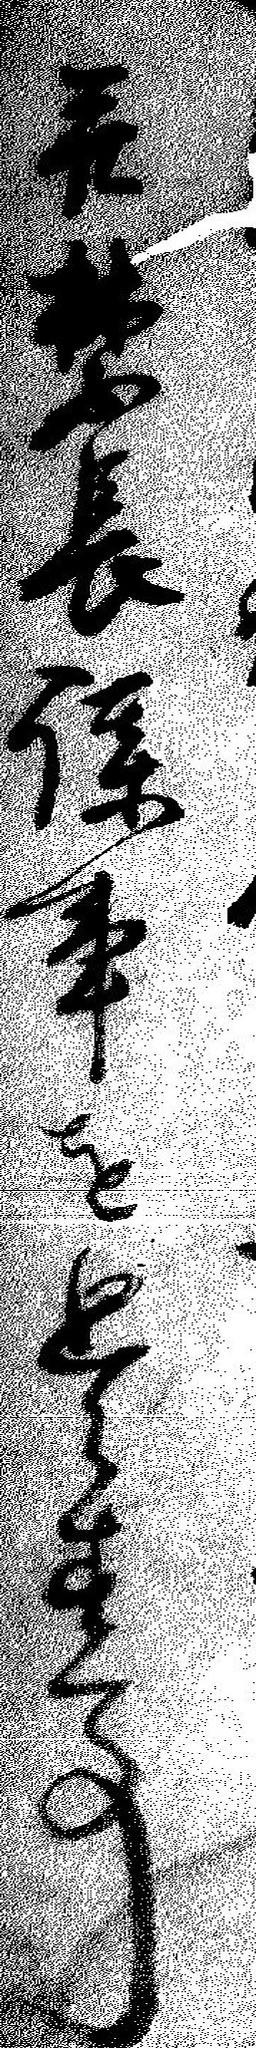并禁長謀事を廻らす事

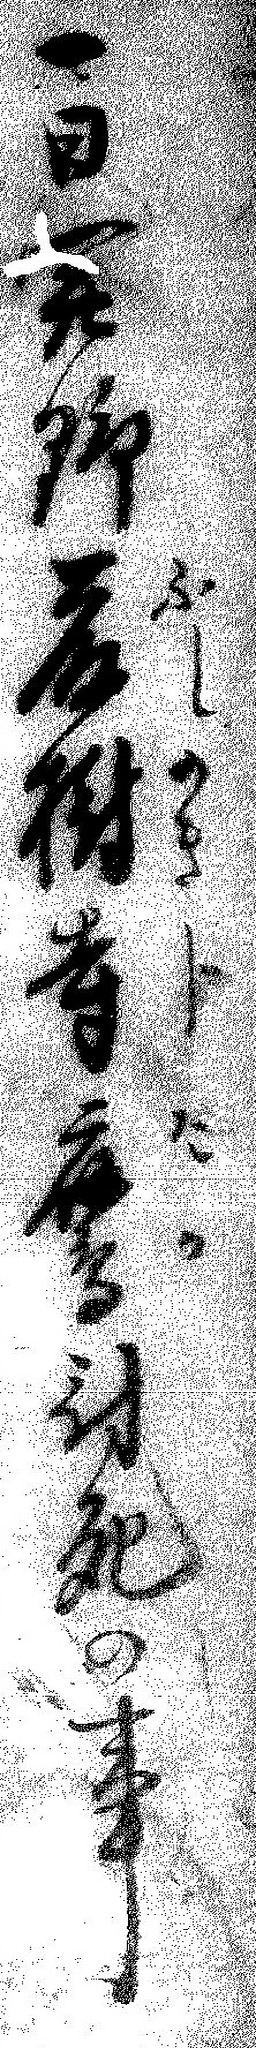一日開野藤樹寺鷹討死の事
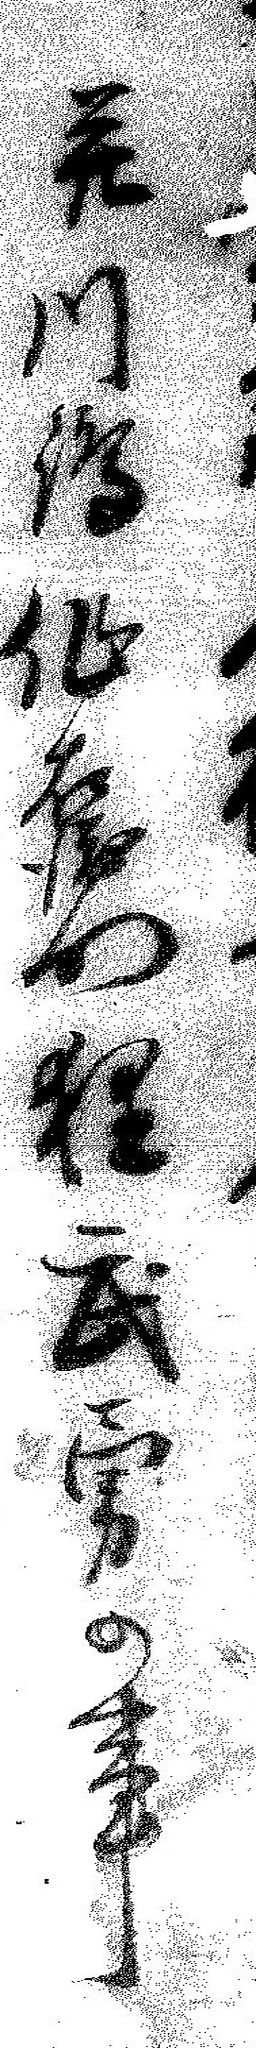并川嶋作右衛門狸武勇の事
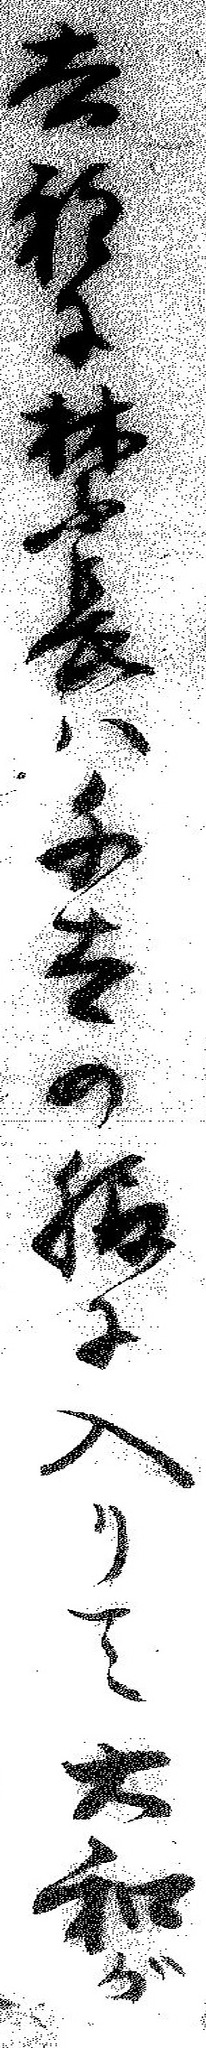去程に禁長は千吉の腹に入りて大和が
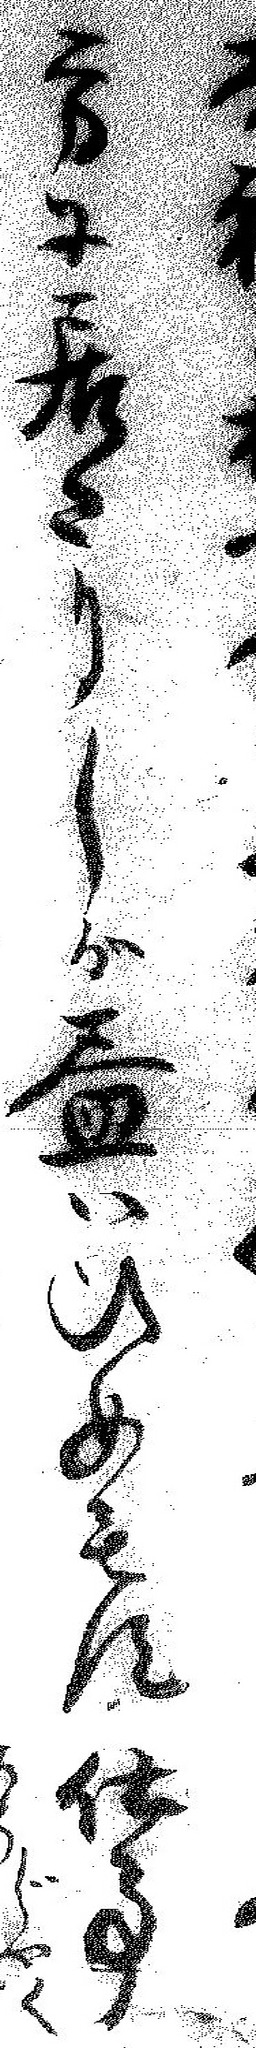方に居たりしが昼はひめもす仕事
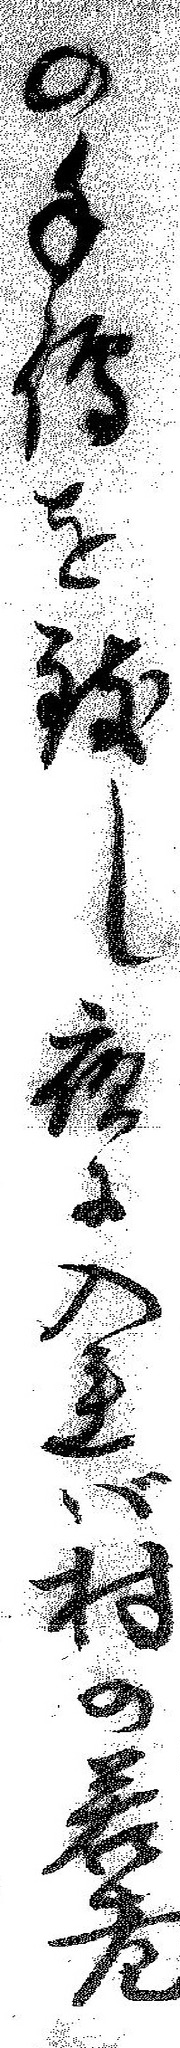の手伝を致し夜に入れば村の老若
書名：近頃古狸珍説　礼義智信
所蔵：徳島県立図書館
